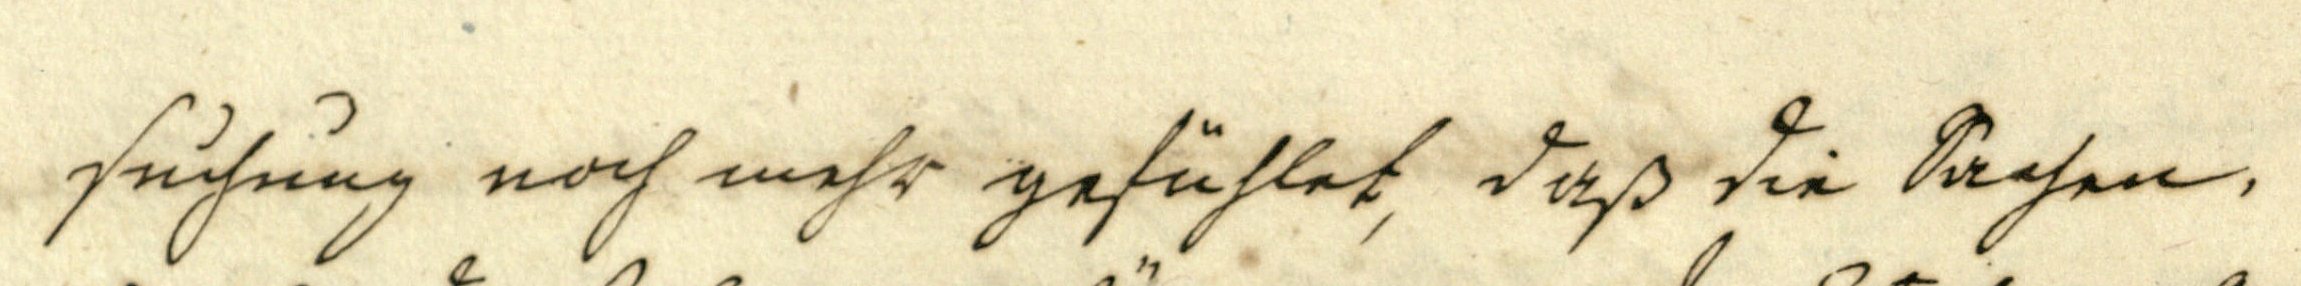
suchung noch mehr gefühlet daß die Sachen,
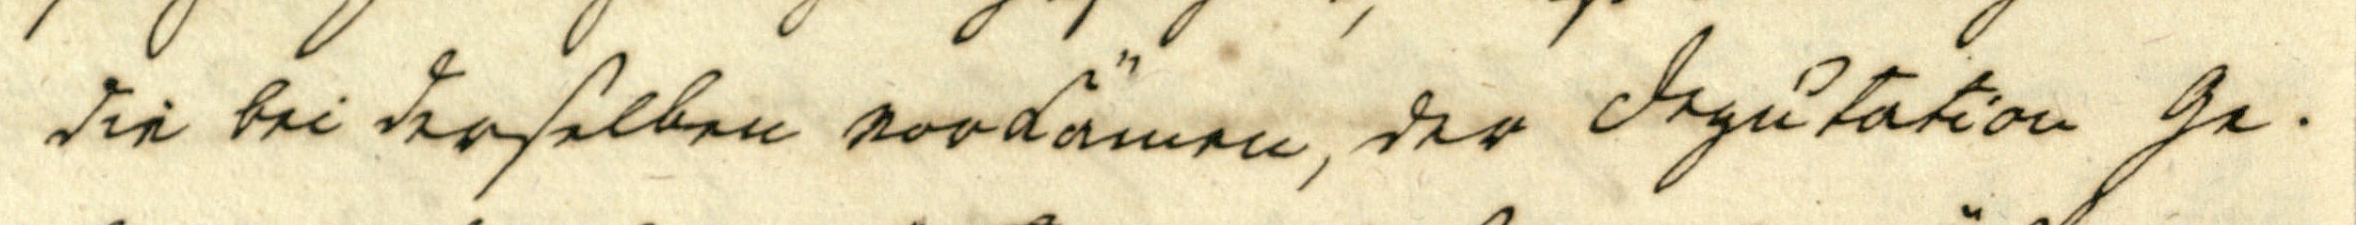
die bei derselben vorkämen, der Deputation Ge¬
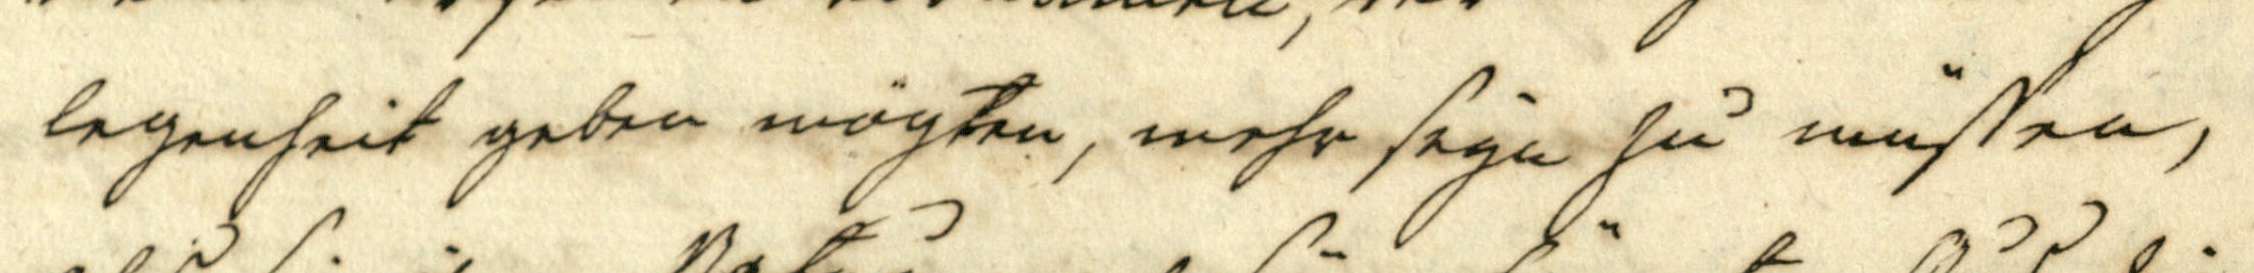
legenheit geben mögten, mehr seÿn zu müssen,
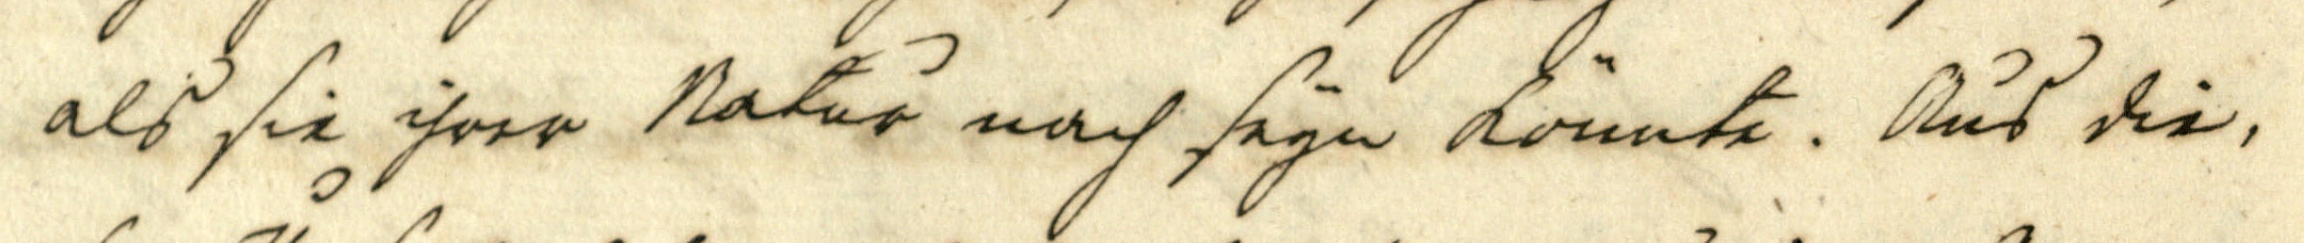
als sie, ihrer Natar nach seÿn könnte. Aus die¬
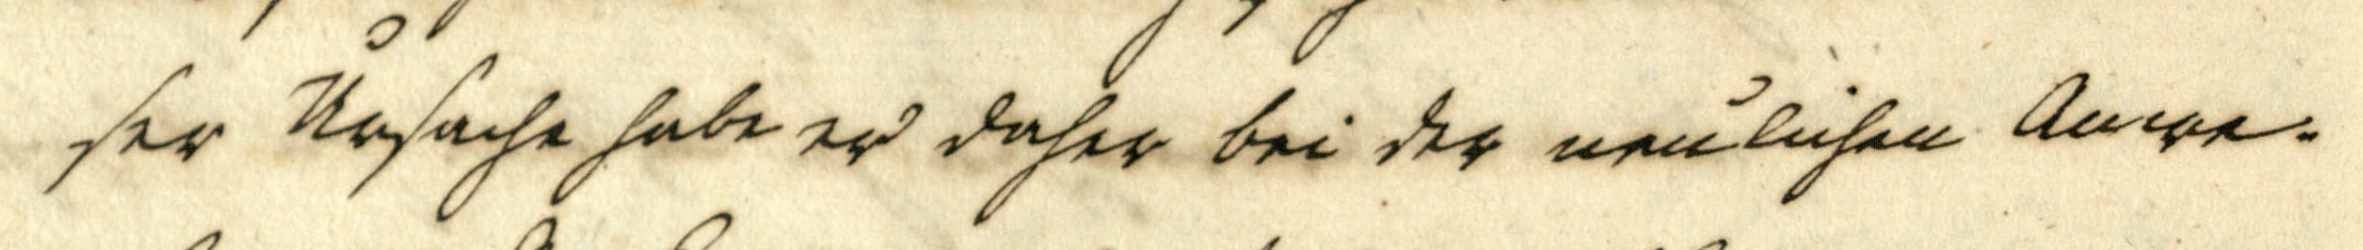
ser Ursache habe er daher bei der neulichen Anwe¬
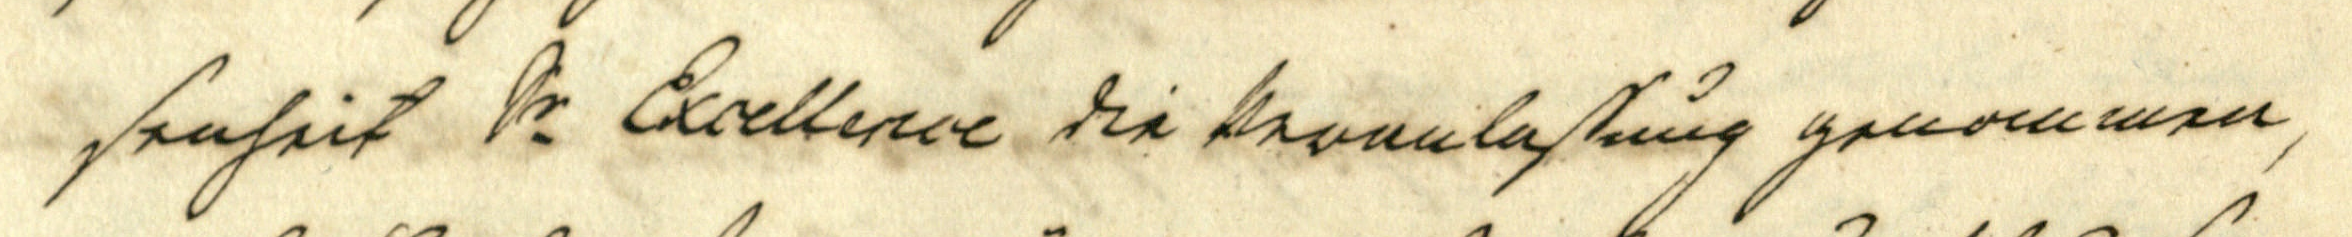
senheit Sr Excellence die Veranlassung genommen,
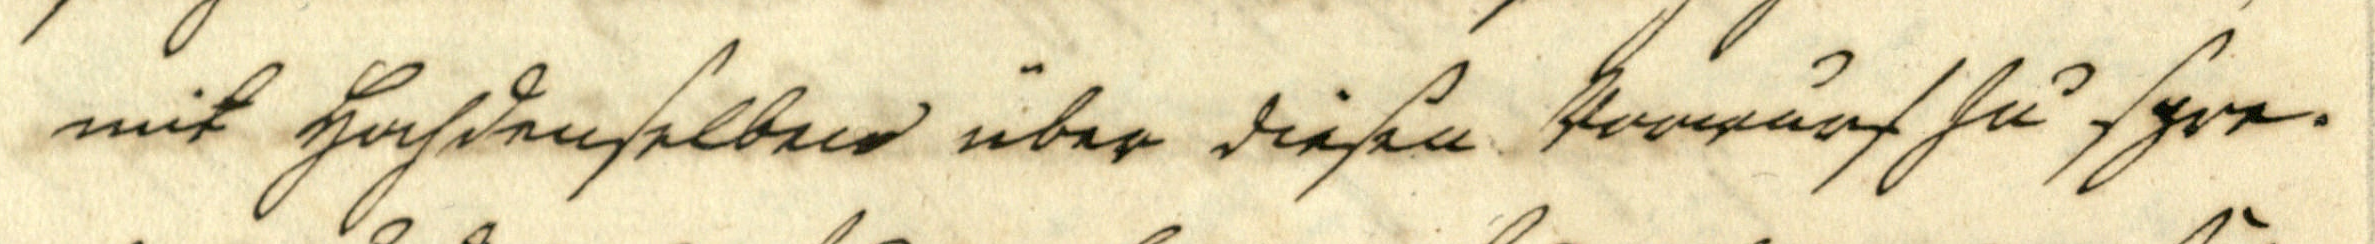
mit Hochdenselben über diesen Vorwurf zu spre¬
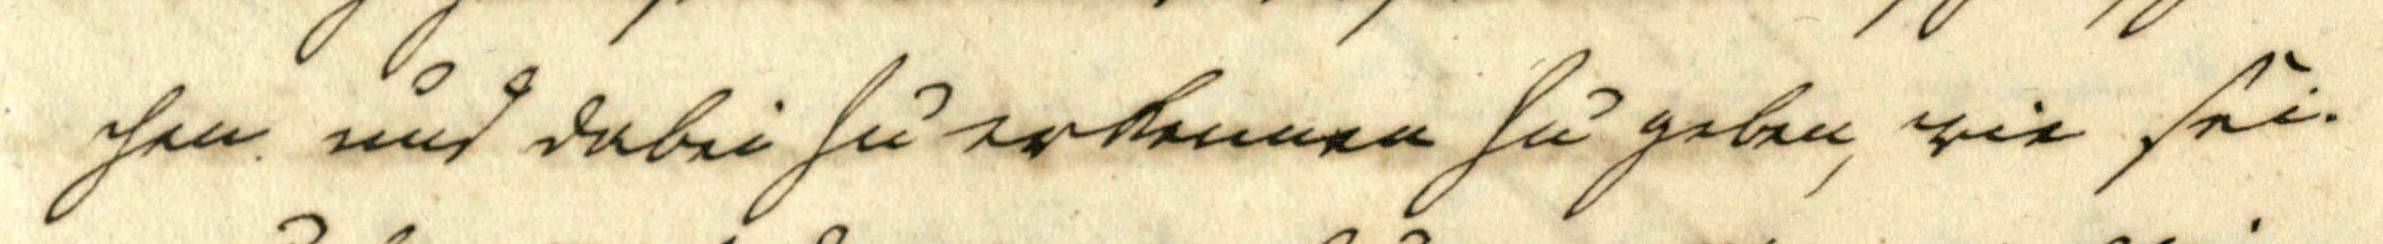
chen und dabei zu erkennen zu geben, wie sei¬
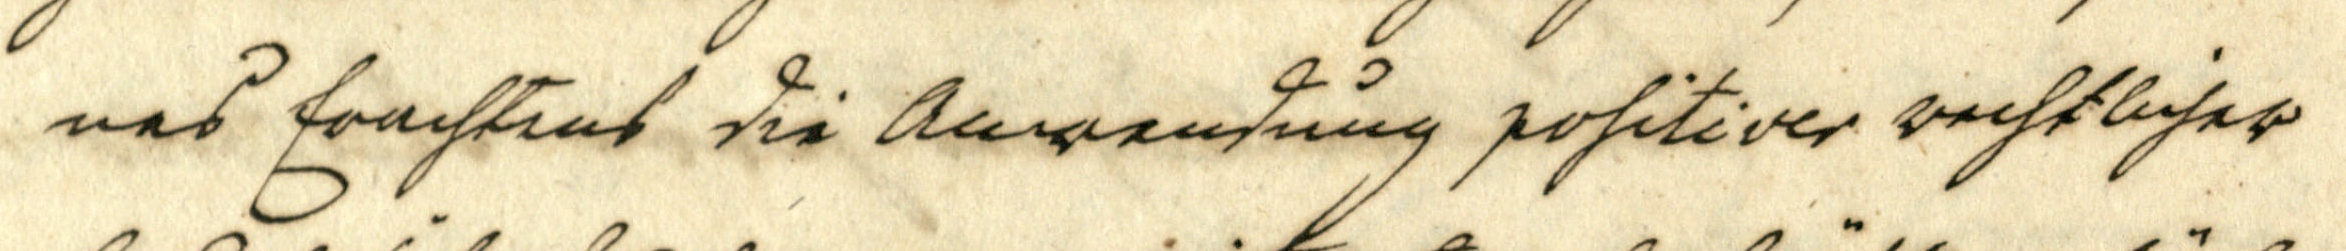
nes Erachtens die Anwendung positiver rechtlicher
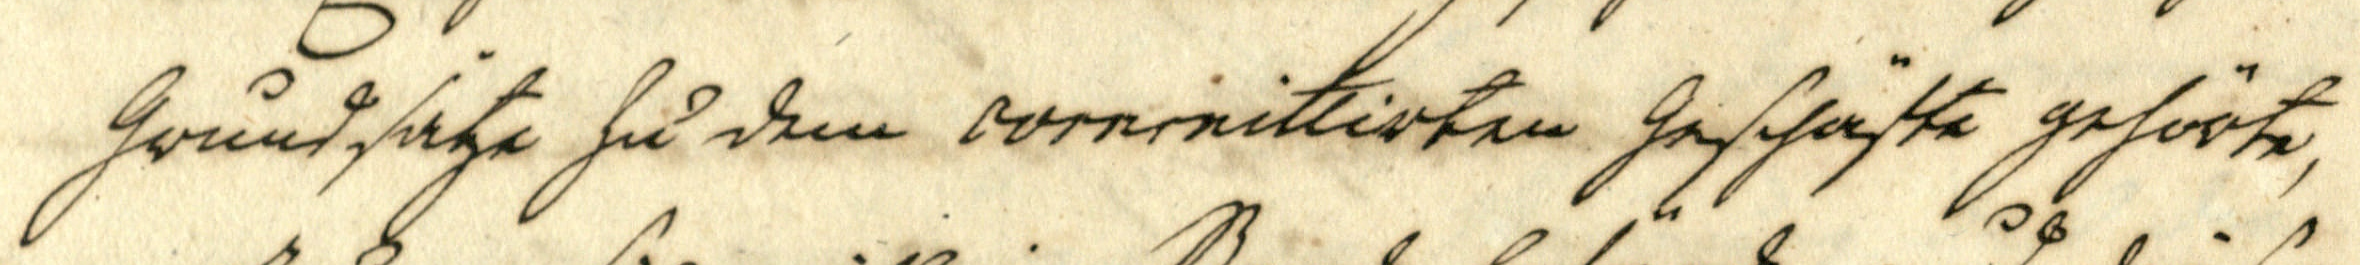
Grundsätze zu dem commitirten Geschäfte gehörte,
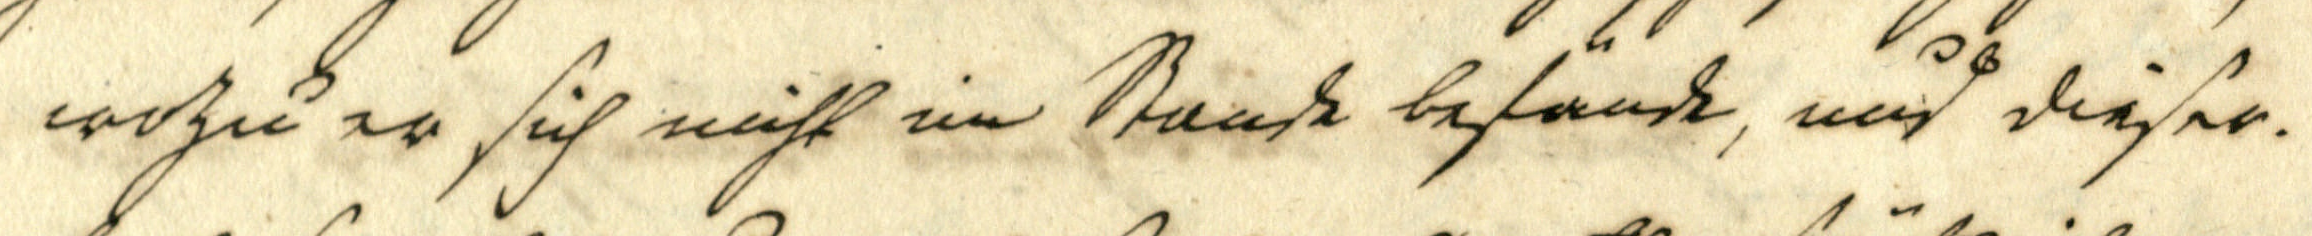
wohzu er sich nicht im Stande befände, und dieser¬
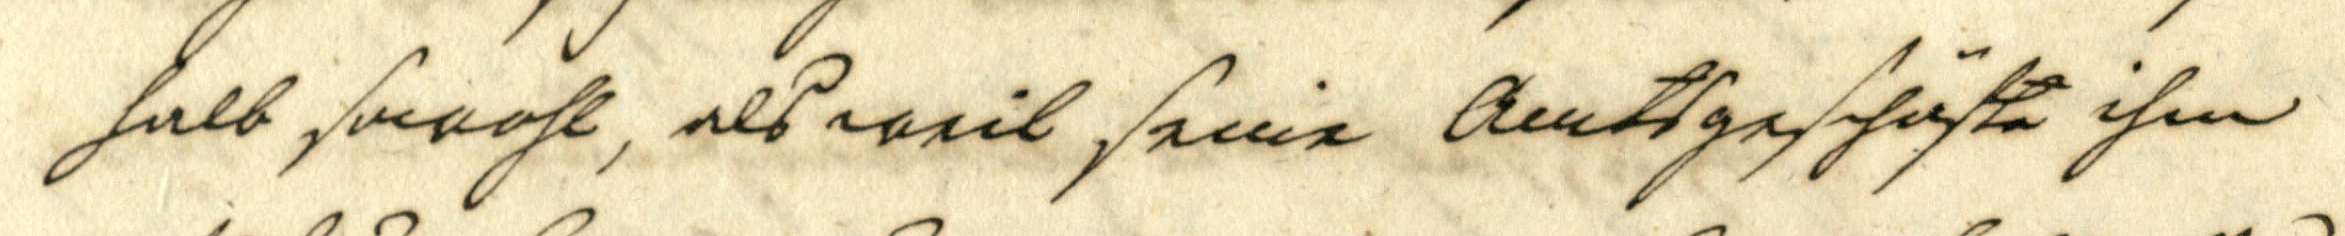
halb sowohl, als weil seine Amtsgeschäfte ihm
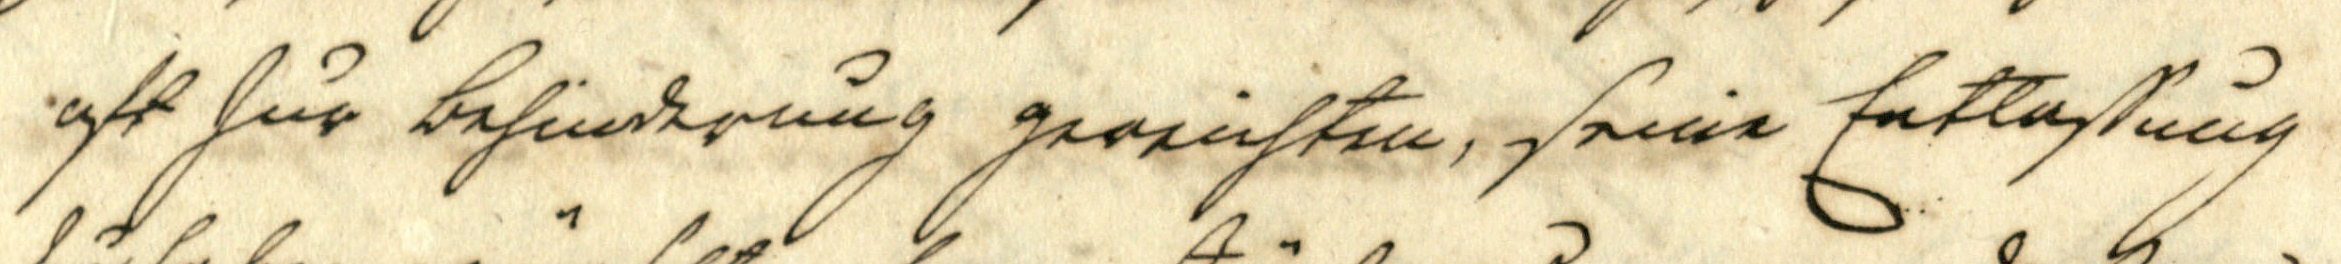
oft zur Behinderung gereichten, seine Entlassung
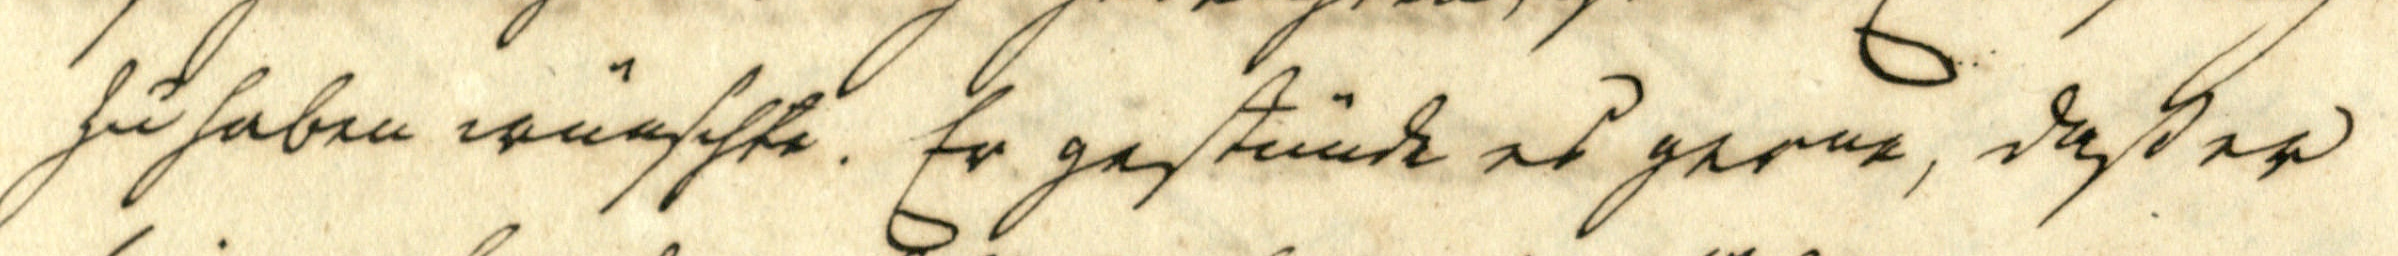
zu haben wünschte. Er gestünde es gerne, daß er
